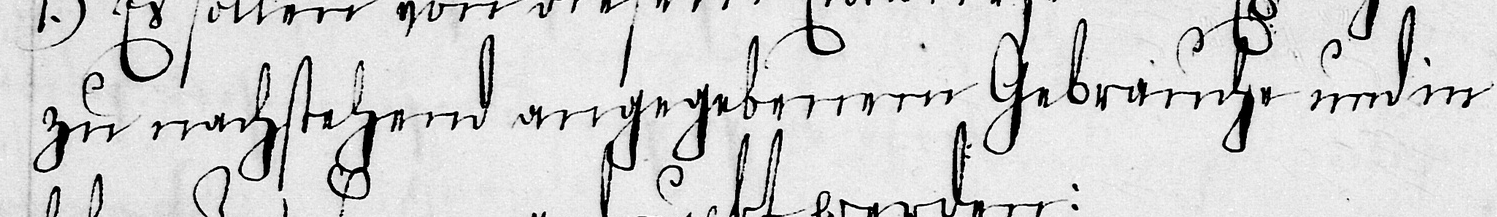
zu nachstehend angegebenem Gebrauche und in
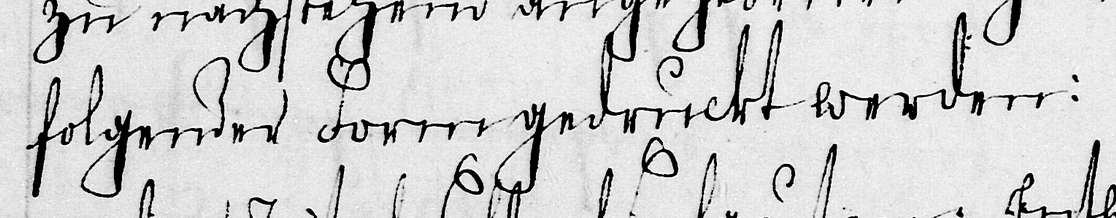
folgender Form gedruckt werden:
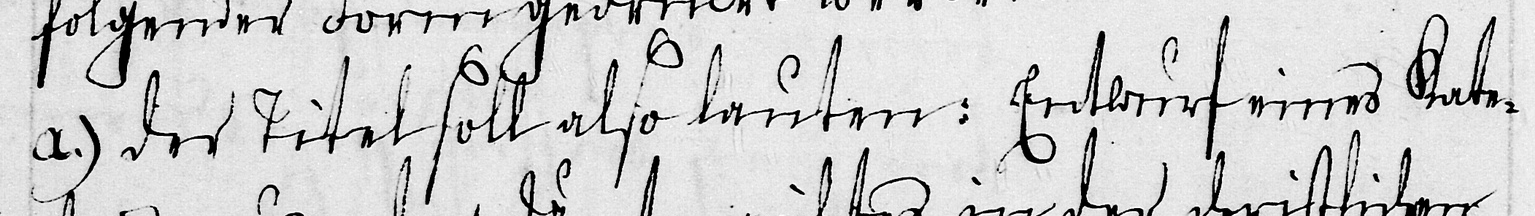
a.) der Titel soll also lauten: Entwurf eines Kate¬
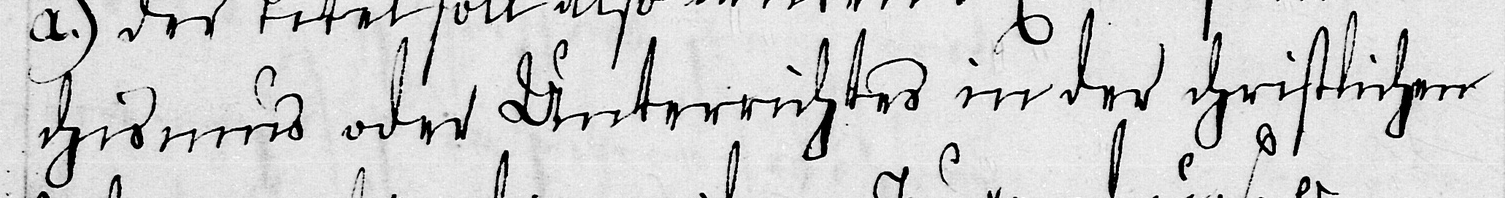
chismus oder Unterrichtes in der christlichen
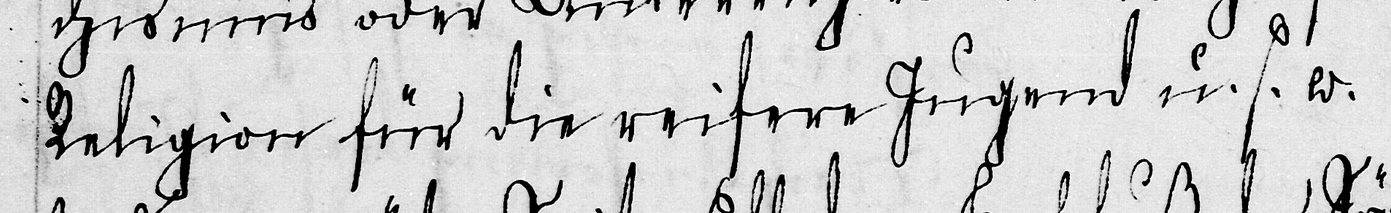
Religion für die reifere Jugend u. s. w.
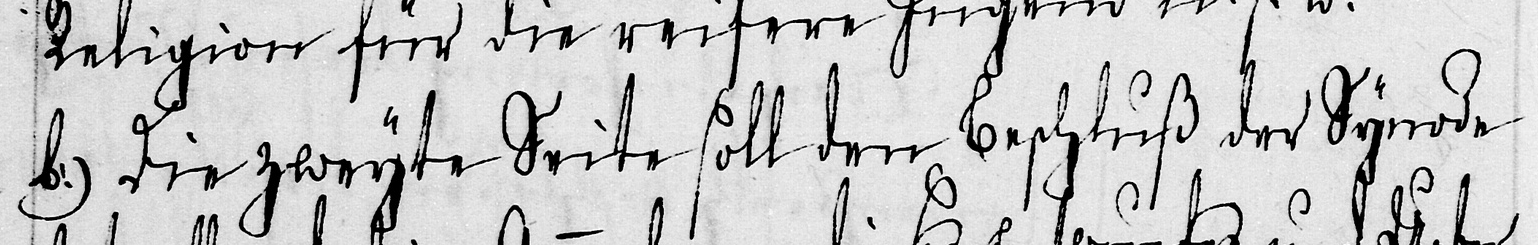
b.) Die zweyte Seite soll den Beschluß der Synode
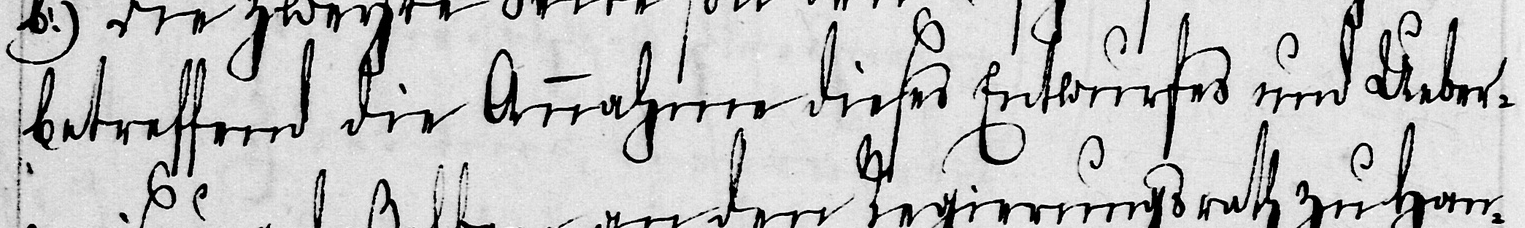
betreffend die Annahme dieses Entwurfes und Ueber¬
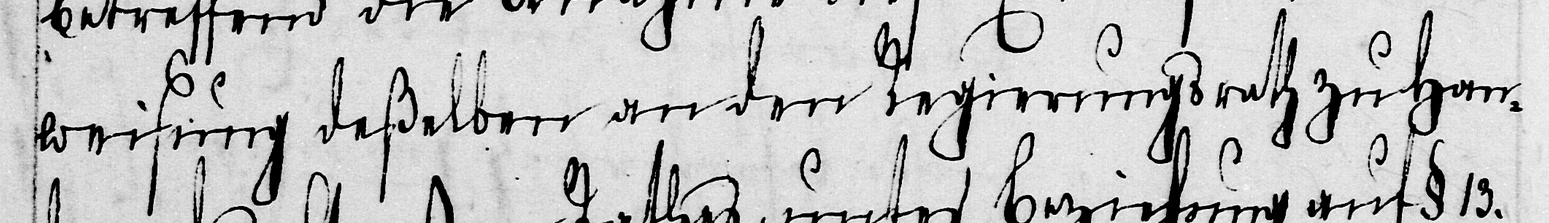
weisung deßelben an den Regierungsrath zu Han¬
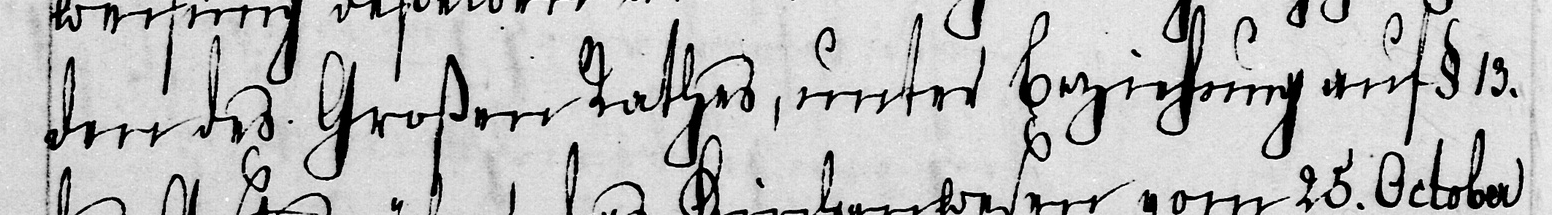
den des Großen Rathes, unter Beziehung auf § 13.
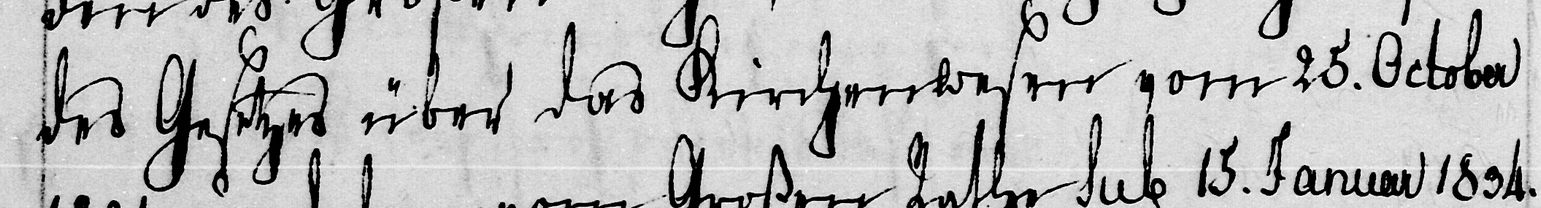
des Gesetzes über das Kirchenwesen vom 25. October
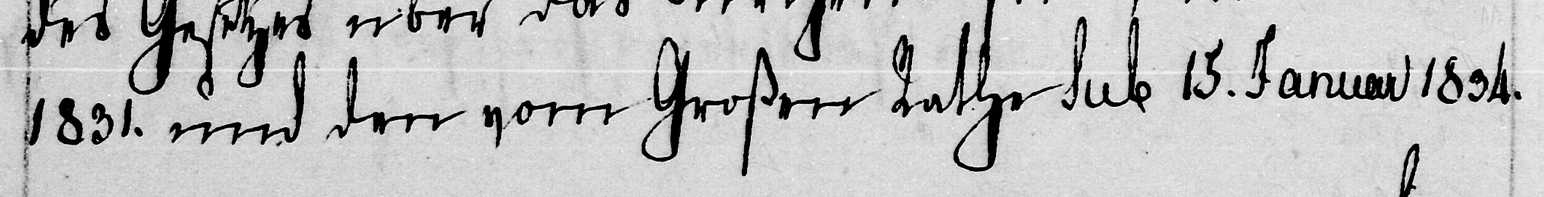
1831. und den vom Großen Rathe sub 15. Januar 1834.
